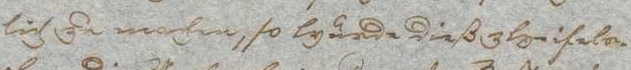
lich zu machen, so würde dieß zweifels-
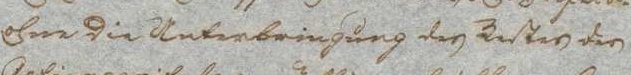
ohne die Unterbringung des Restes des
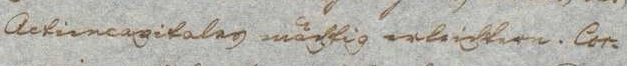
Actiencapitales mächtig erleichtern. Cor-
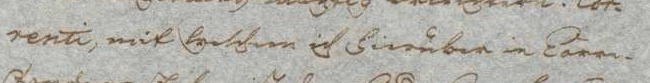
renti, mit welchem ich hierüber in Corre-
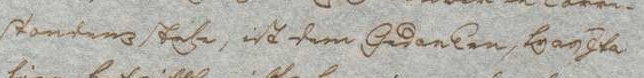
spondenz stehe, ist dem Gedanken, was Ita-
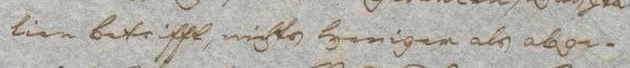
lien betrifft, nichts weniger als abge-
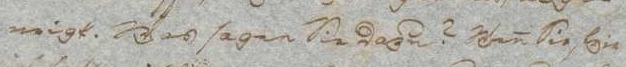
neigt. Was sagen Sie dazu? Wenn Sie, wie
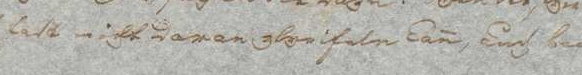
fast nicht daran zweifeln kann, auch bei-
